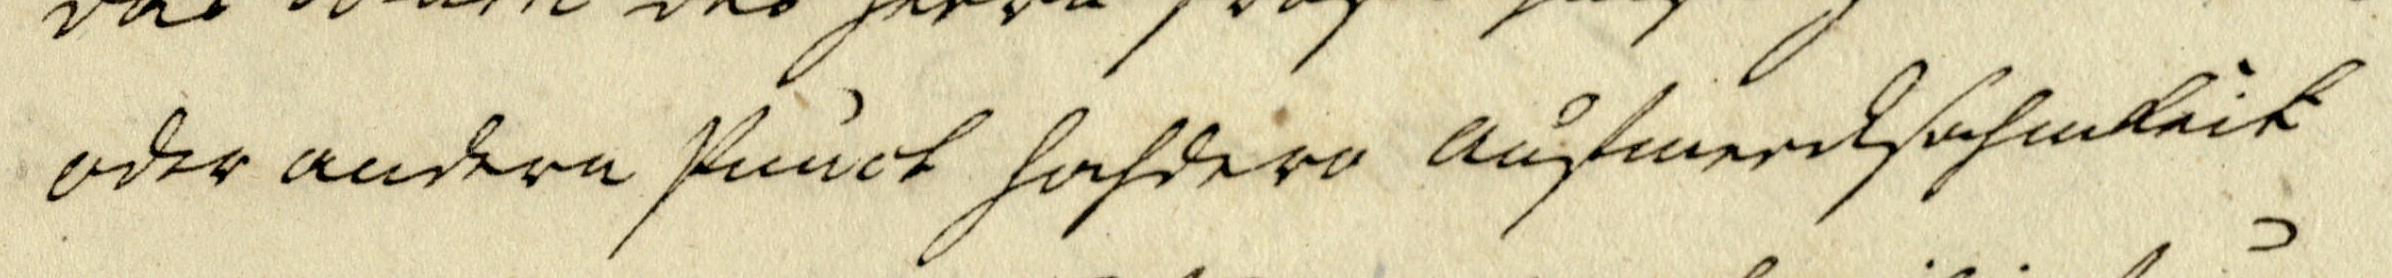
oder andern Punct hochdero Aufmercksahmkeit
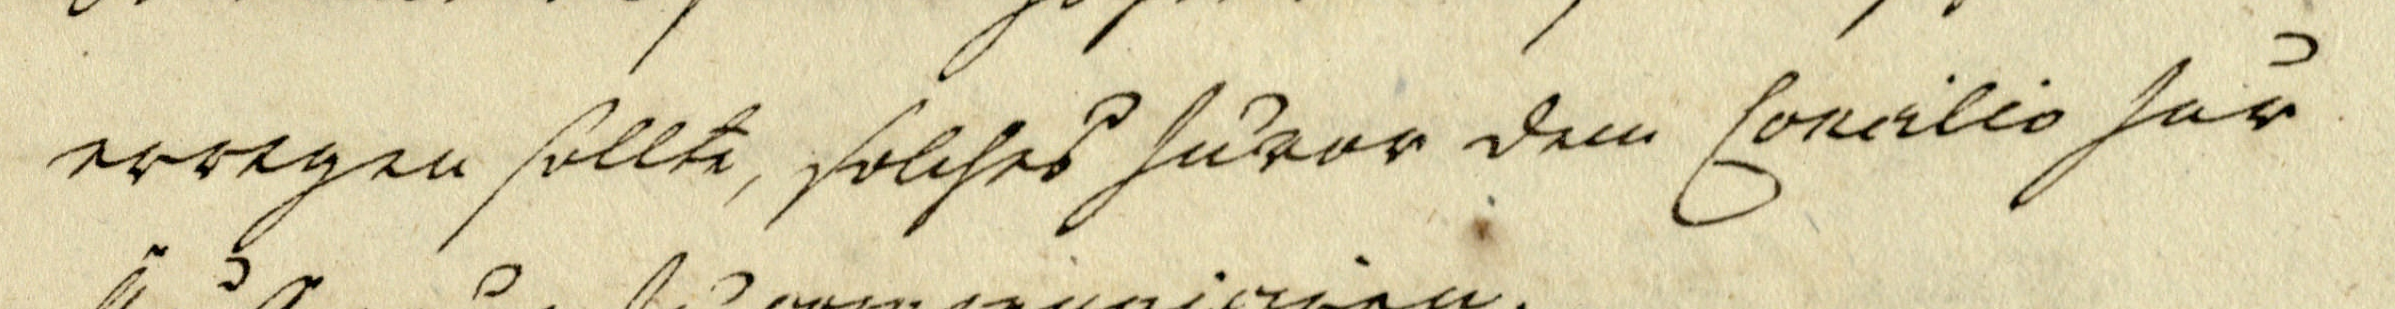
erregen sollte, solches zuvor dem Concilio zur
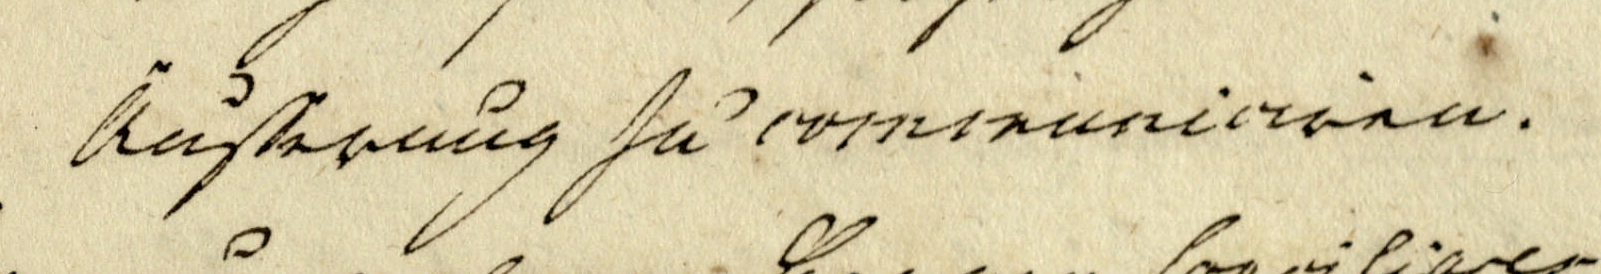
Äusserung zu communiciren.
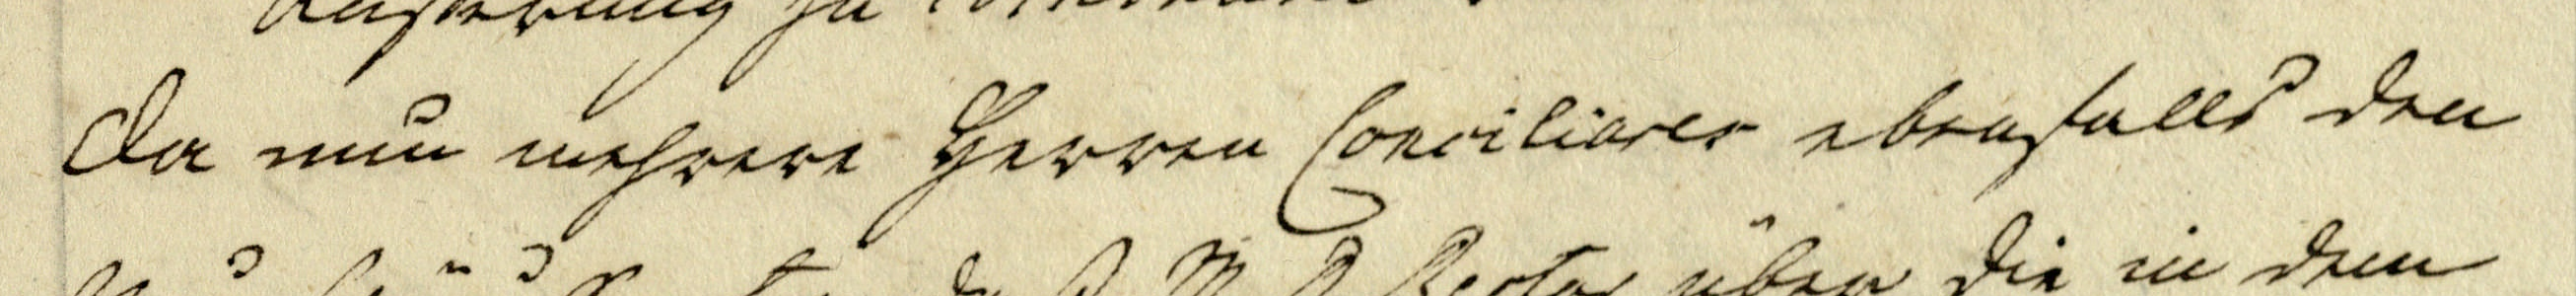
Da nun mehrere Herren Conciliares ebenfalls den
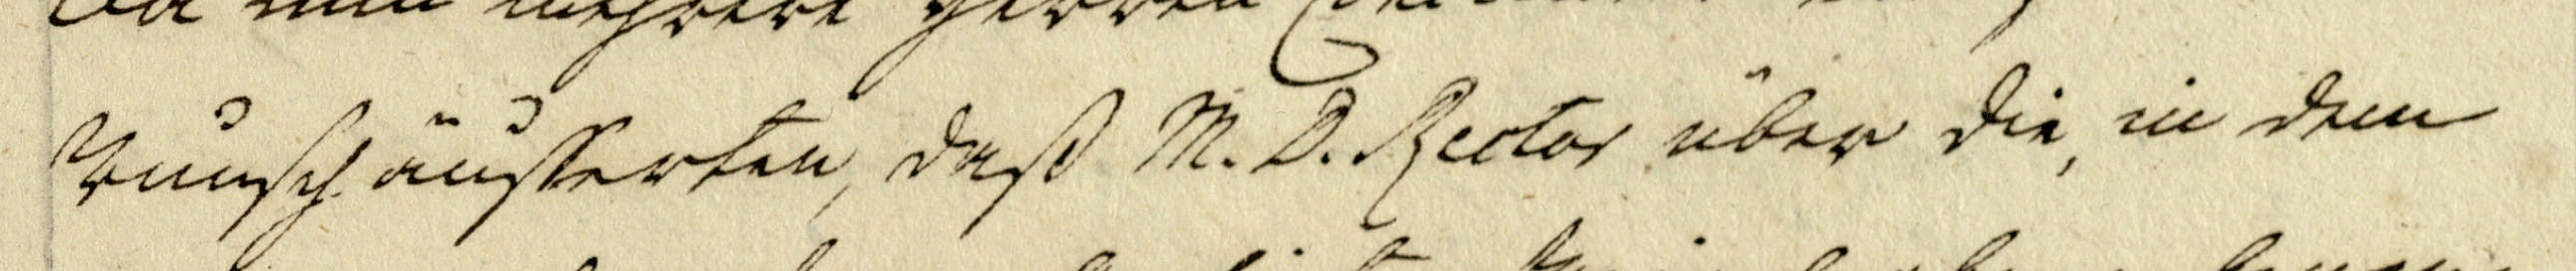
Wunsch äusserten, daß M. D. Rector über die, in dem
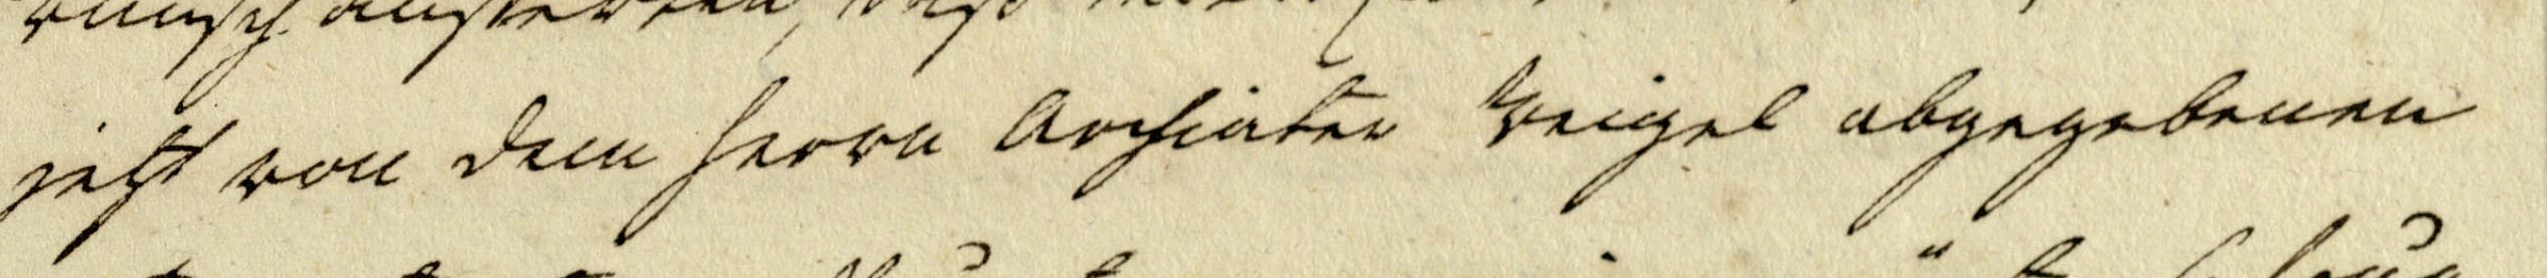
jetzt von dem Herrn Archiater Weigel abgegebenen
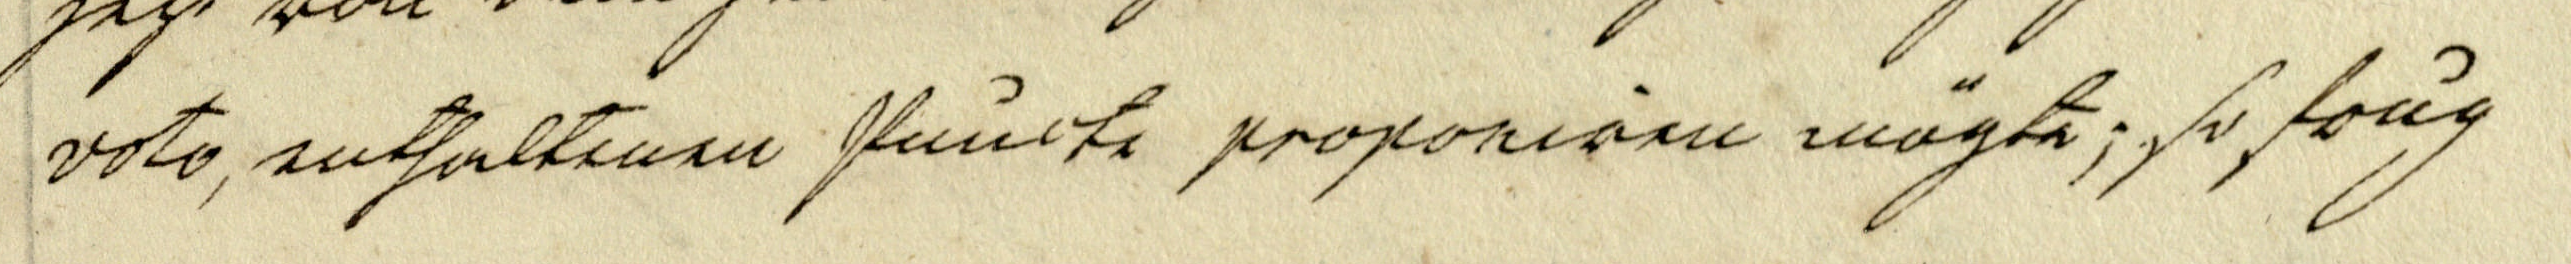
voto, enthaltenen Puncte proponiren mögte; so frug
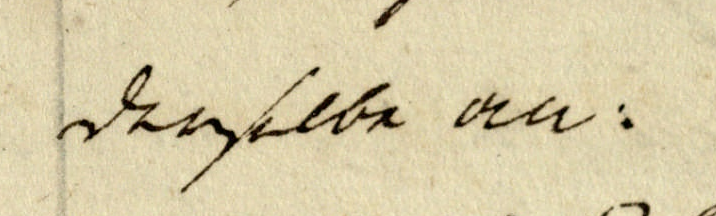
derselbe an:
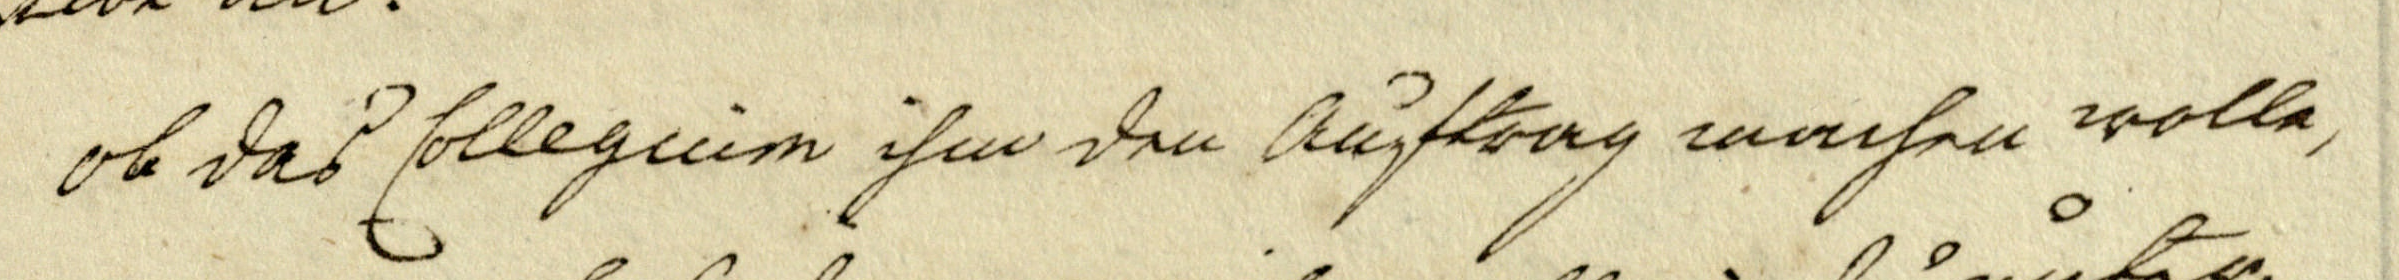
ob das Collegium ihm den Auftrag machen wolle,
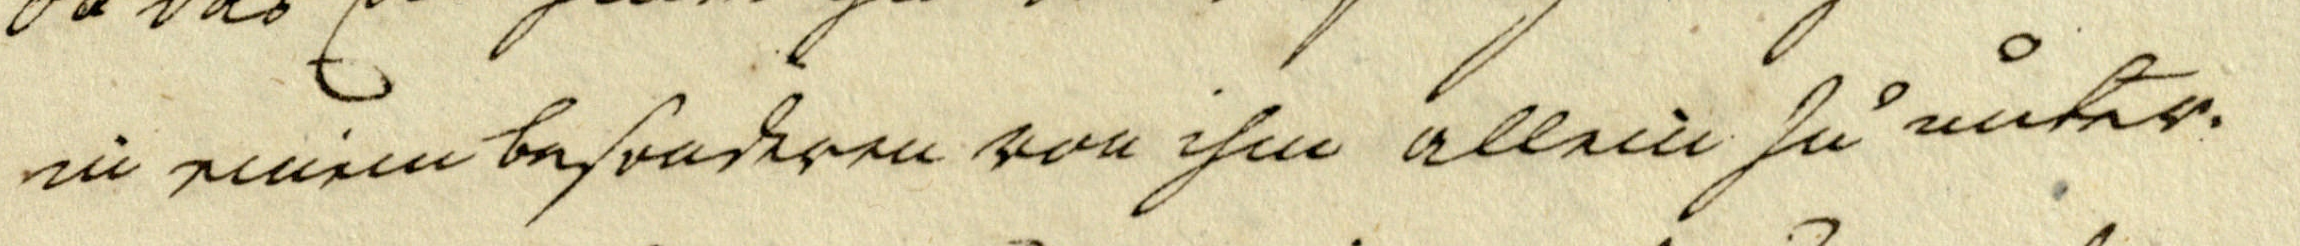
in einem besonderen von ihm allein zu unter¬
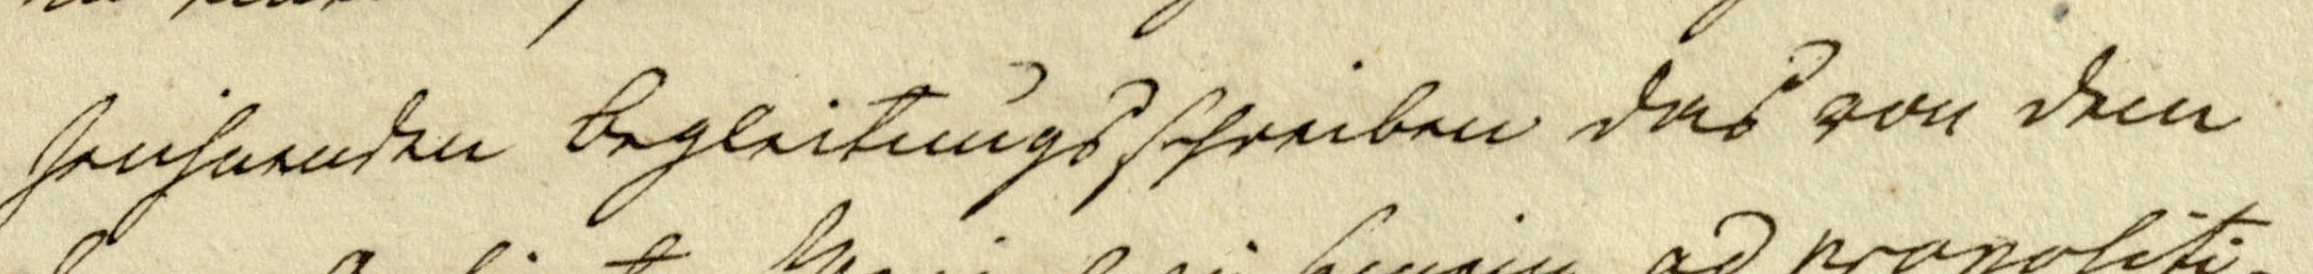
zeichnenden Begleitungsschreiben das von dem
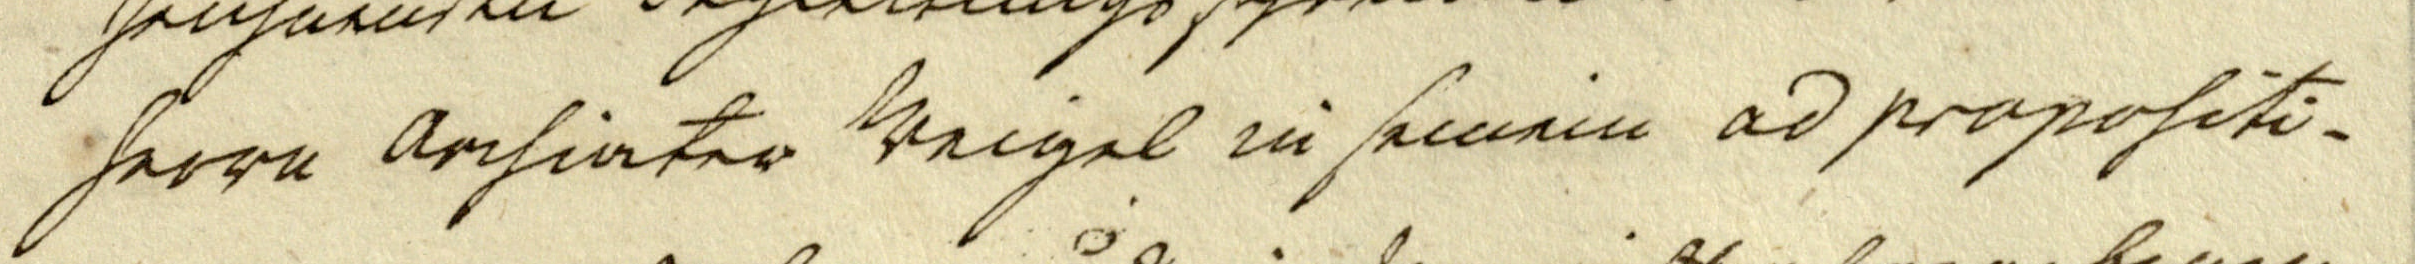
Herrn Archiater Weigel in seinem ad propositi¬
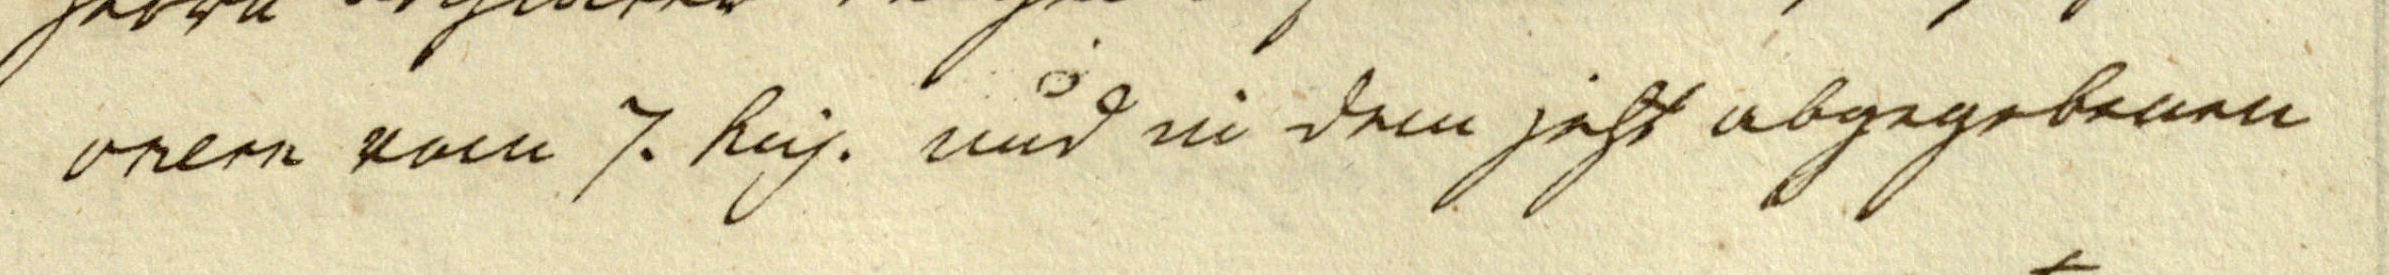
onem vom 7. huj. und in dem jetzt abgegebenen
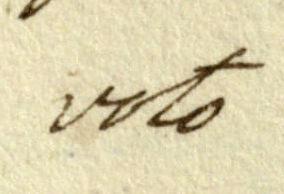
voto
